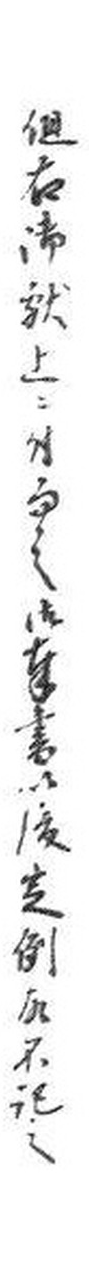但右御献上ニ付而之御奉書以後定例故不記之
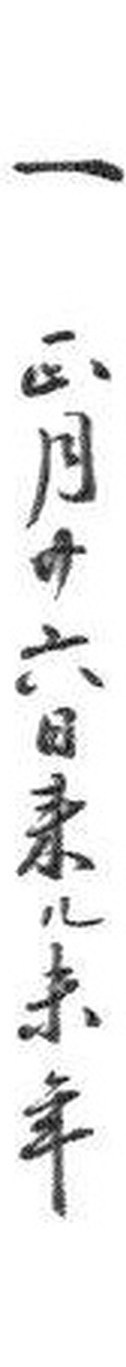一正月廿六日来ル未年
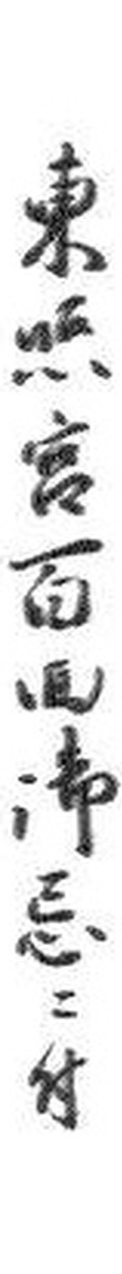東照宮百回御忌ニ付
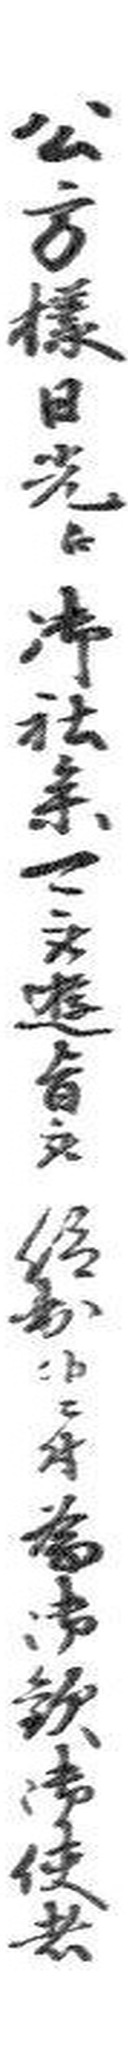公方様日光江御社参可被遊旨被仰出候ニ付為御歓御使者
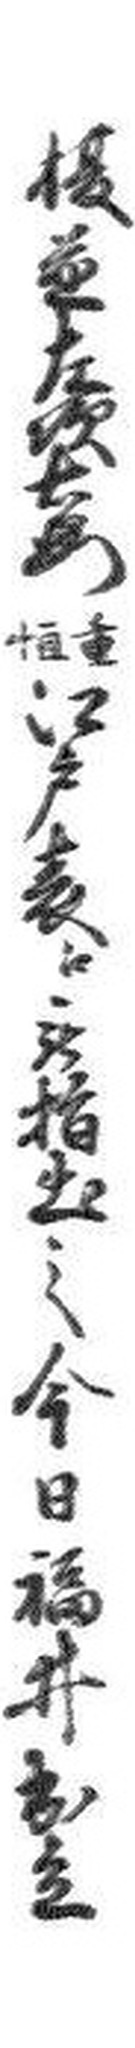榎並左次右衛門重恒江戸表江被指出之今日福井出立
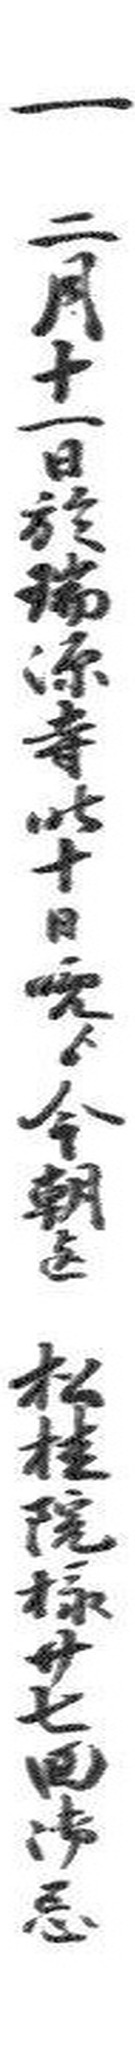一二月十一日於瑞源寺昨十日晩ゟ今朝迄松桂院様廿七回御忌
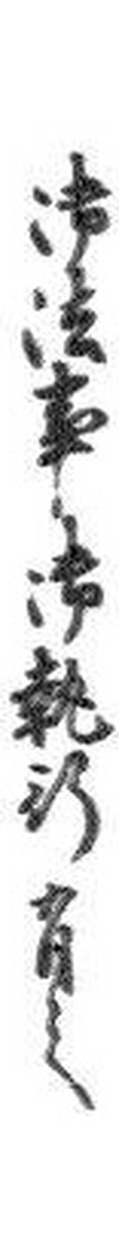御法事御執行有之
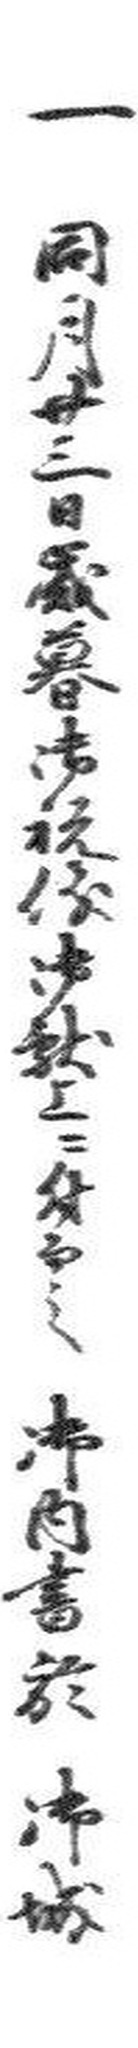一同月廿三日歳暮御祝儀御献上ニ付而之御内書於御城
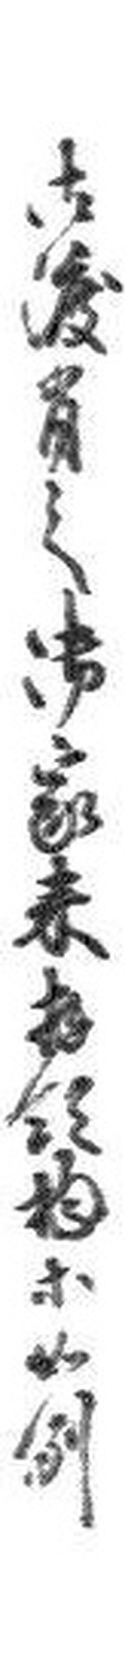御渡有之御家来拝領物等如例
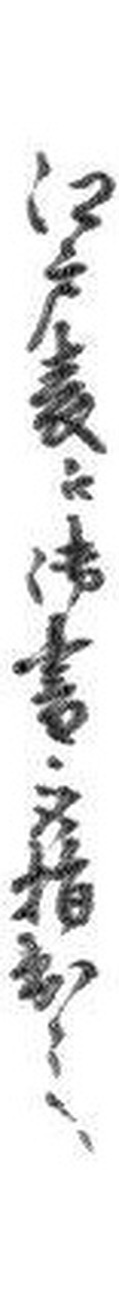江戸表江御書被指出之
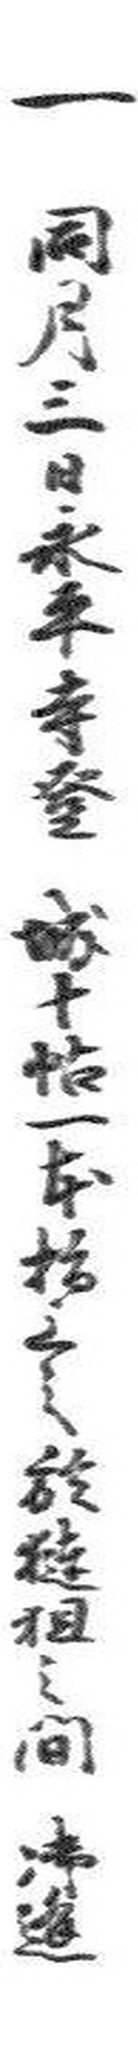一同月三日永平寺登城十帖一本指上之於韃靼之間御逢

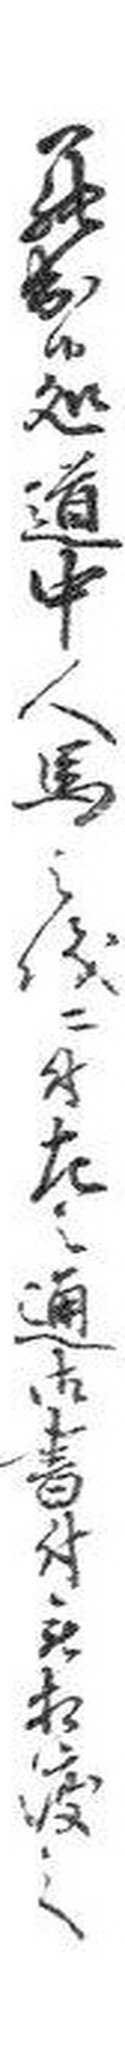罷出候処道中人馬之儀ニ付左之通御書付被相渡之
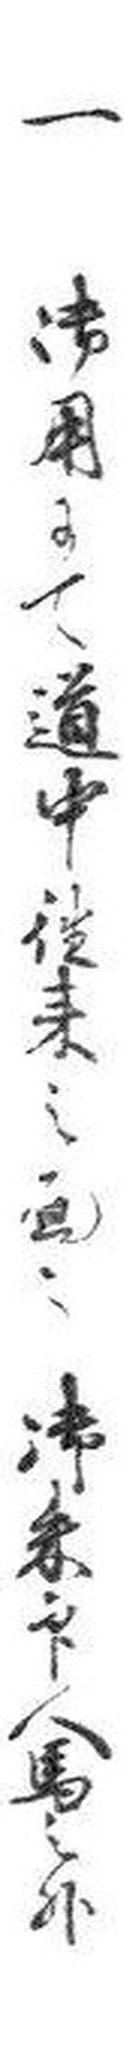一御用にて道中往来之面々御朱印人馬之外
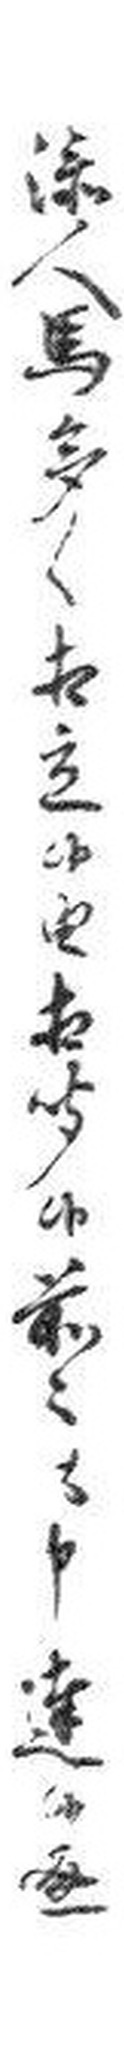添人馬多く相立候由相聞候前々も申達候通
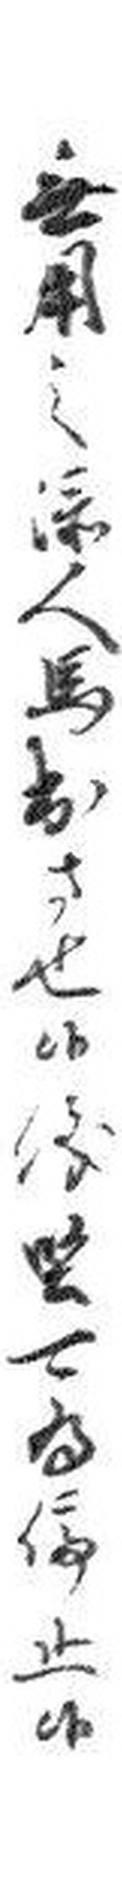無用之添人馬出させ候儀堅可為停止候
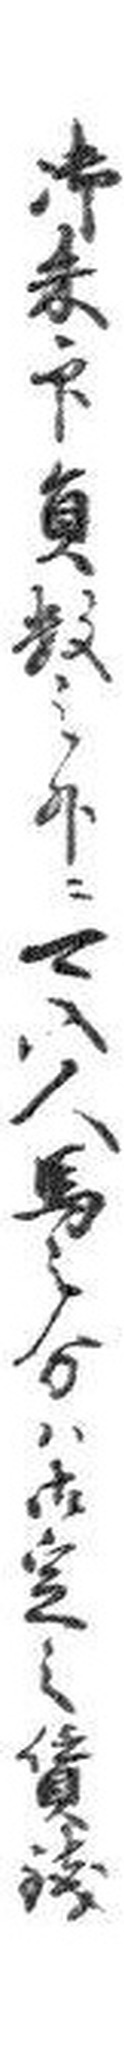御朱印員数之外ニ可入人馬之分ハ御定之賃銭
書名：家譜 二十九 吉邦公 従正徳二年到正徳三年
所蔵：福井県文書館 Fukui Prefectural Archives
